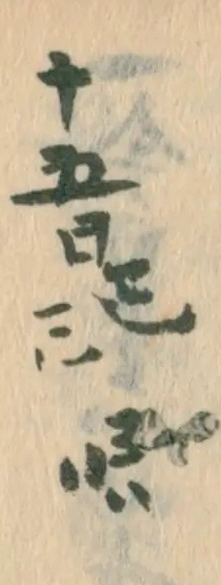十五日己巳晴

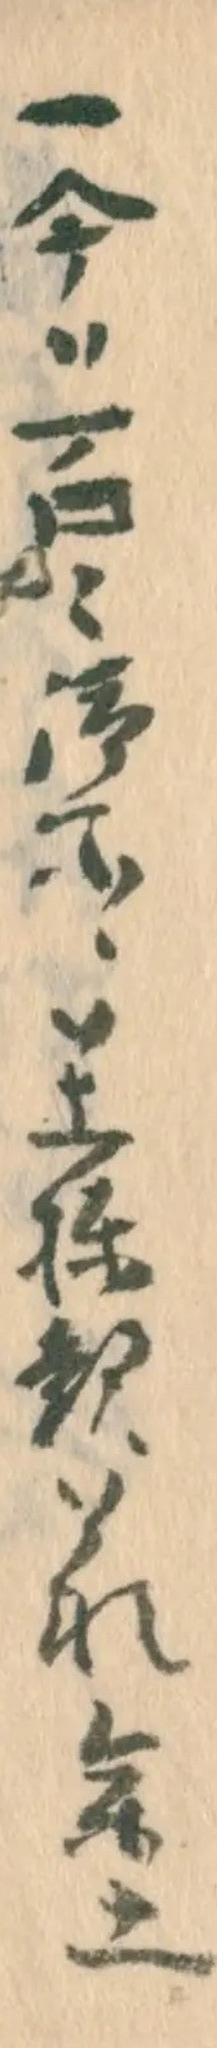一今日百々御所へ御上棟歓御礼参上
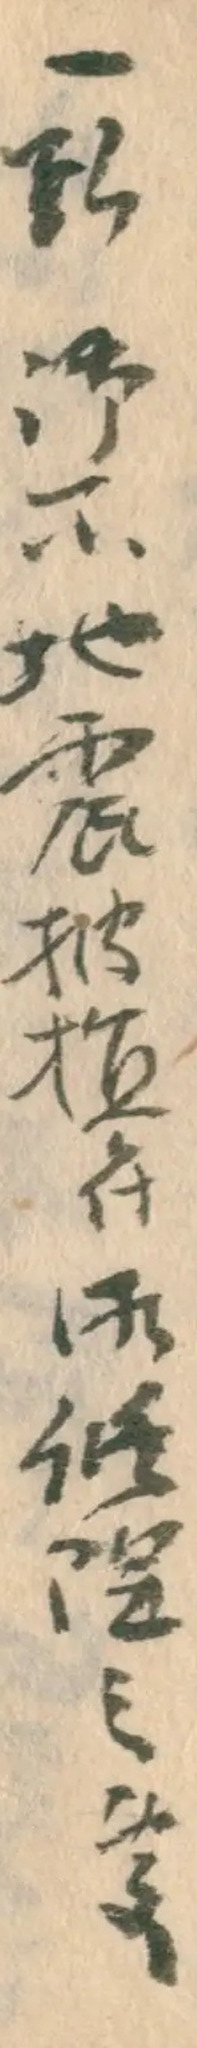一御所地震破損ニ付御修理之処
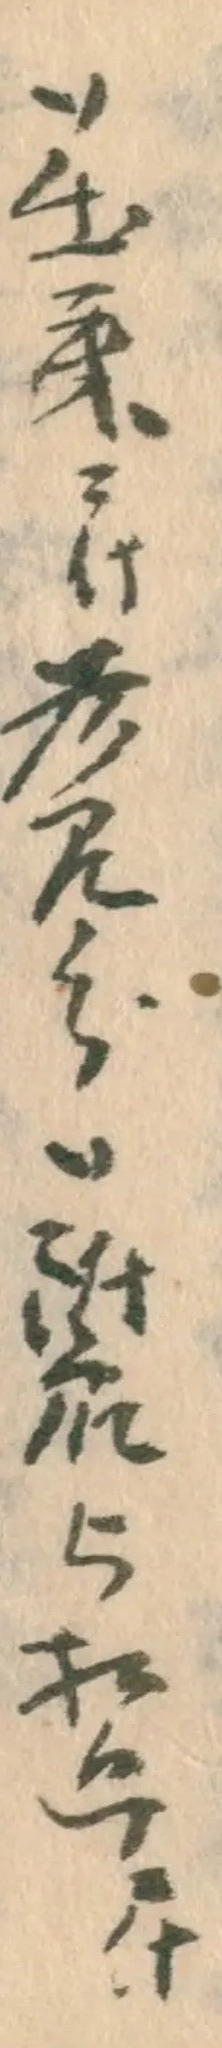御出来ニ付為見分御附衆被相廻ニ付
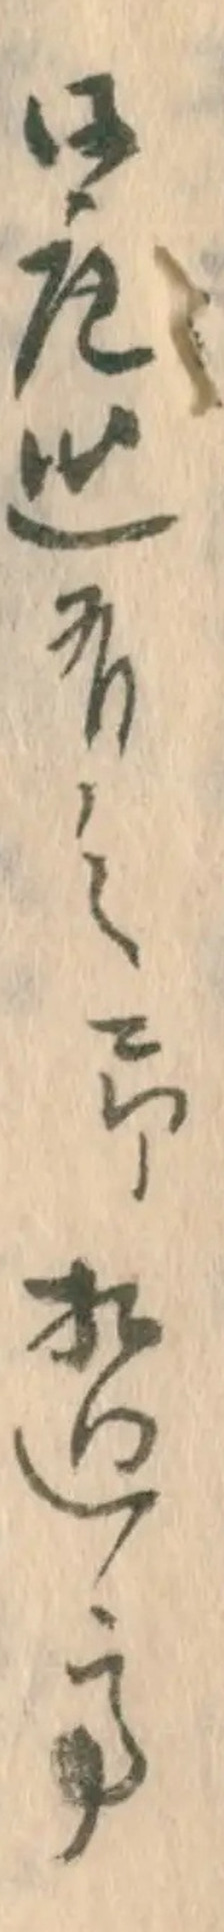御庭廻有之予相廻候事
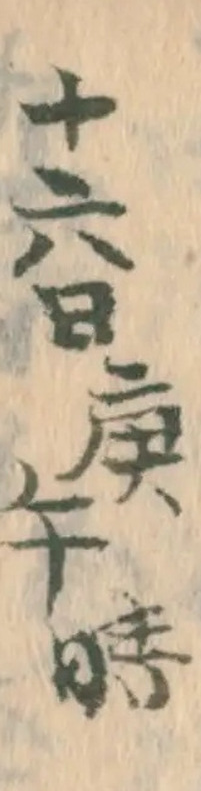十六日庚午晴
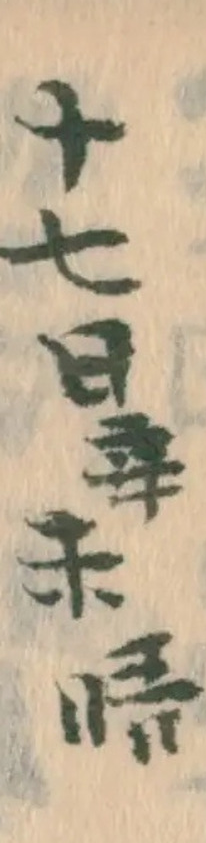十七日辛未晴
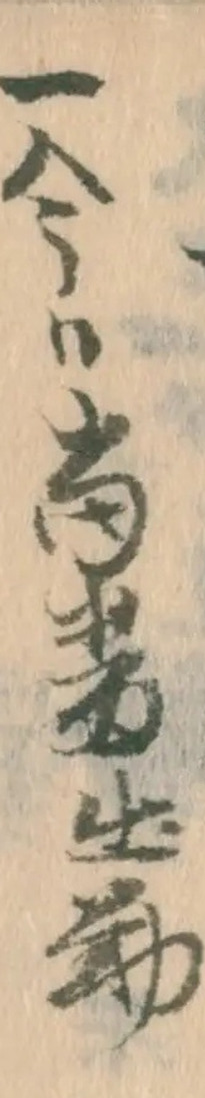一今日当番出勤
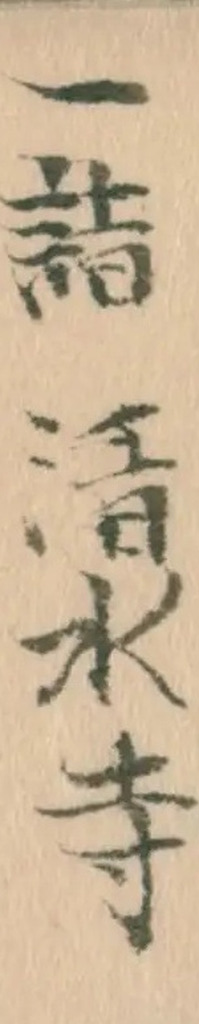一詣清水寺
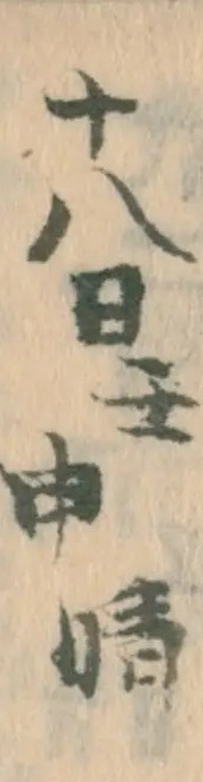十八日壬申晴
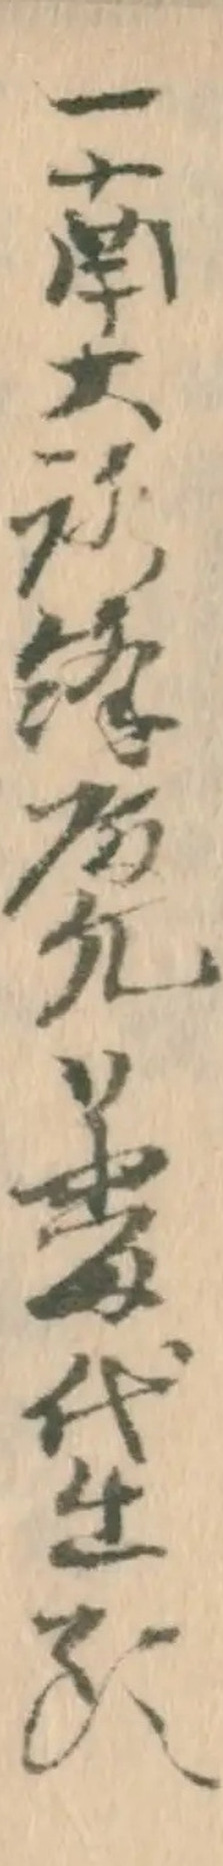一南大路縫殿允御番代出頭
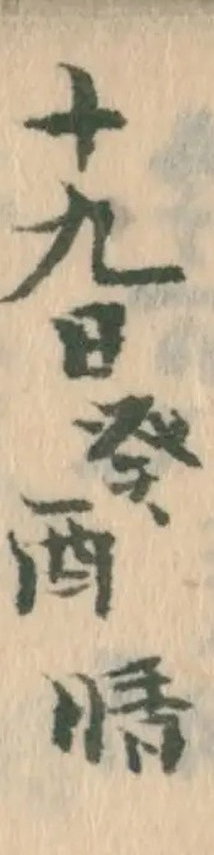十九日癸酉晴
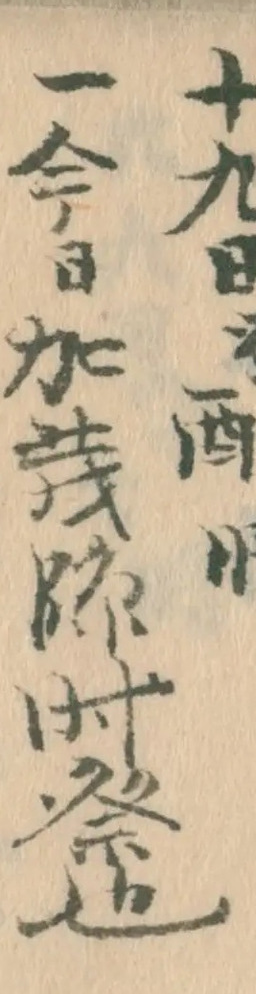一今日加茂臨時祭也
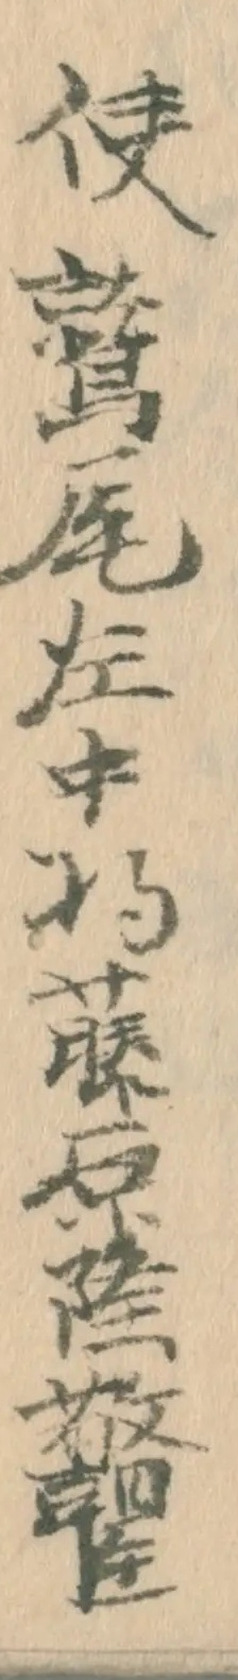使鷲尾左中将藤原隆敬朝臣

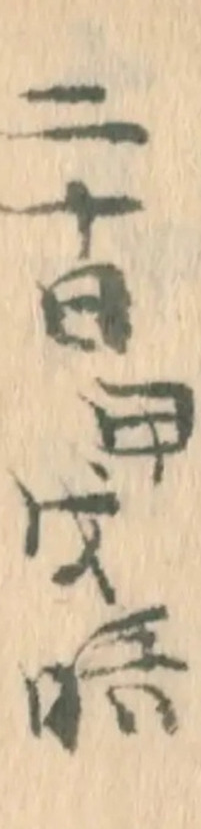二十日甲戌晴
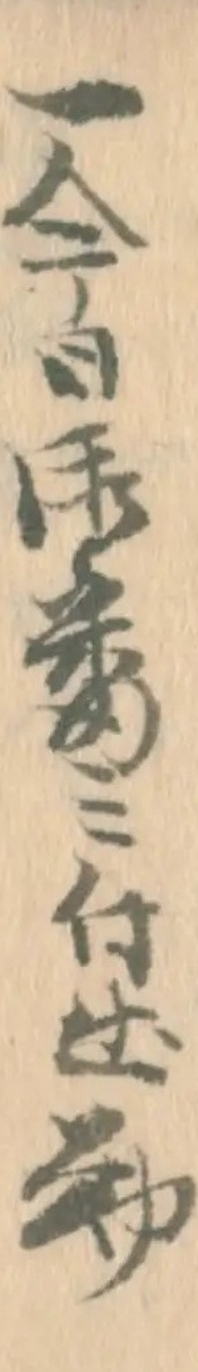一今日御番ニ付出勤
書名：禁裏御所御用日記. [131]
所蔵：国立国会図書館 National Diet Library, JAPAN
